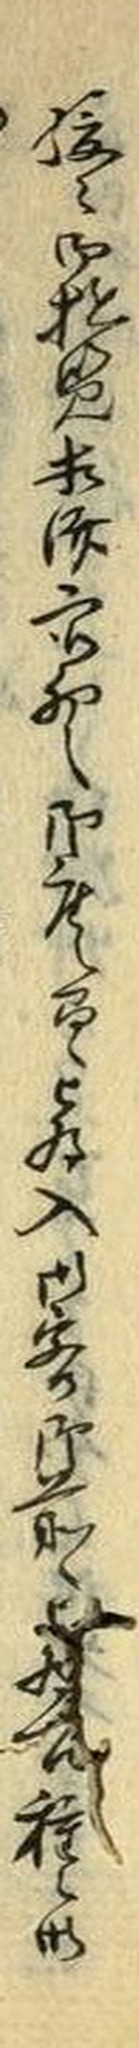緩々御遊覧相済最初之御座之間へ被為入御客御前へ被為召種々御
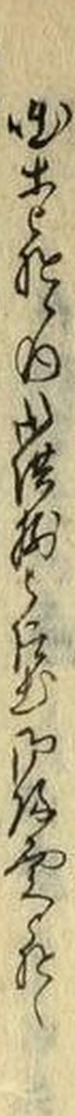咄等被遊候内御供揃被仰出御帰殿被遊候
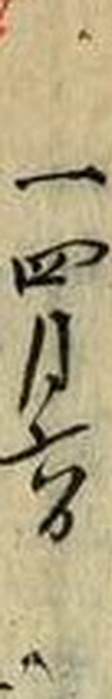一四月六日
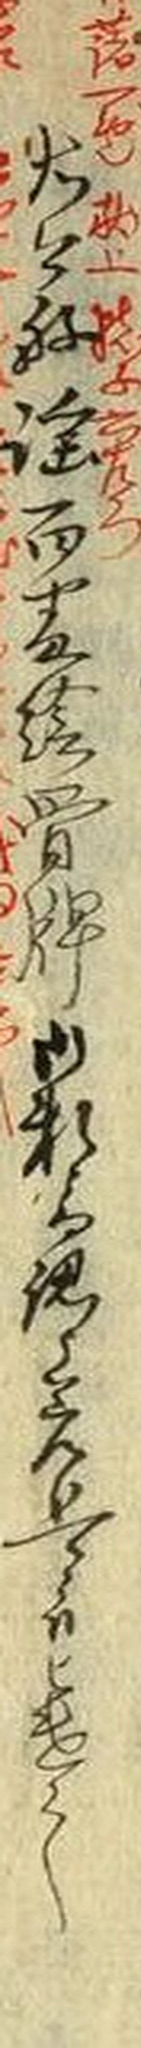右今般謡百番絵骨牌御頼ニ而認被差上候ニ付被遣之
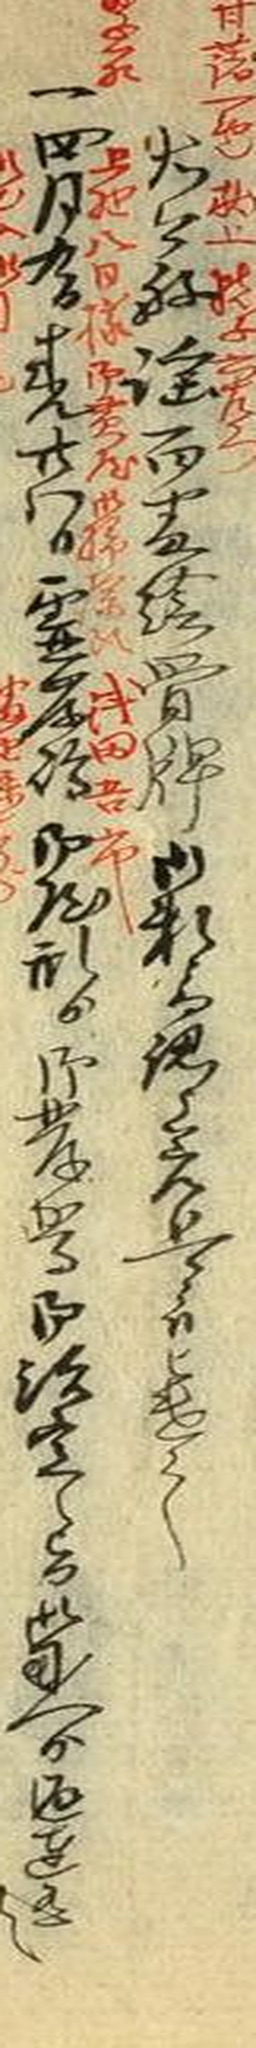一四月九日来ル廿八日霊岸嶋御屋形ゟ御発駕御治定之旨御用人ゟ御達有之
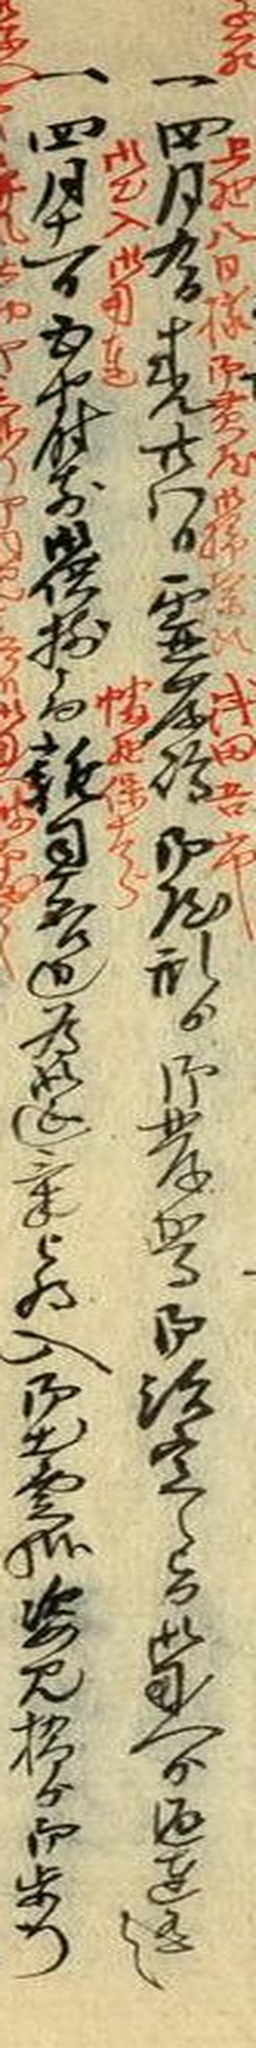一四月十一日五半時前御供揃ニ而雑司ヶ谷辺為御延気被為入御出殿掛姿見橋ゟ御歩行
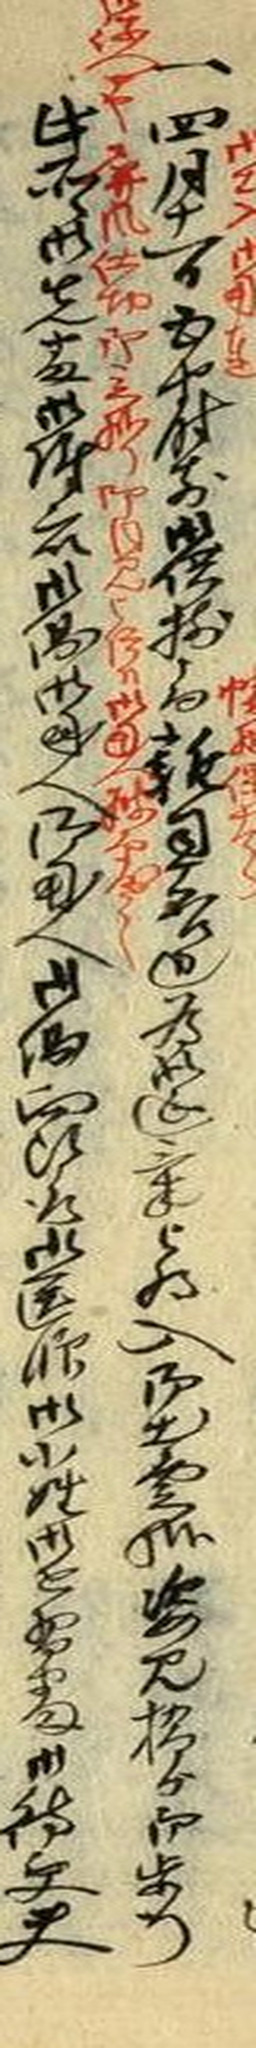此所へ御先番御附衆御側御用人御用人御側向頭取御医師御小姓御近習番御待受夫
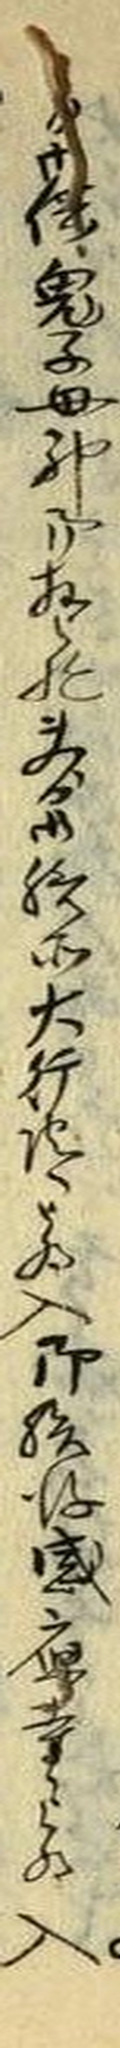ゟ御供鬼子母神御拝被遊夫ゟ御膳所大行院へ被為入御膳後感応寺へ被為入
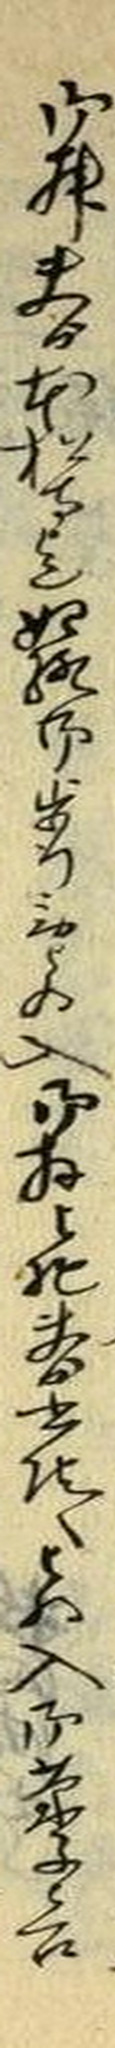御拝夫ゟ本松寺迄始終御歩行ニ而被為入御拝被遊夫ゟ書院へ被為入御菓子被召
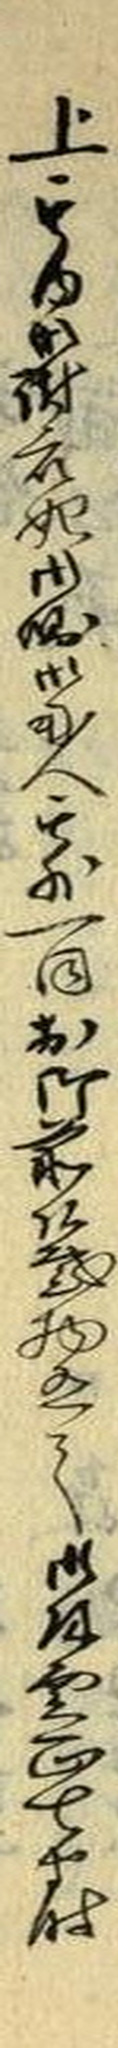上其内御附衆始御側御用人其外一同於御前頂戴物有之御帰殿正七半時
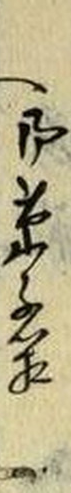御菓子箱
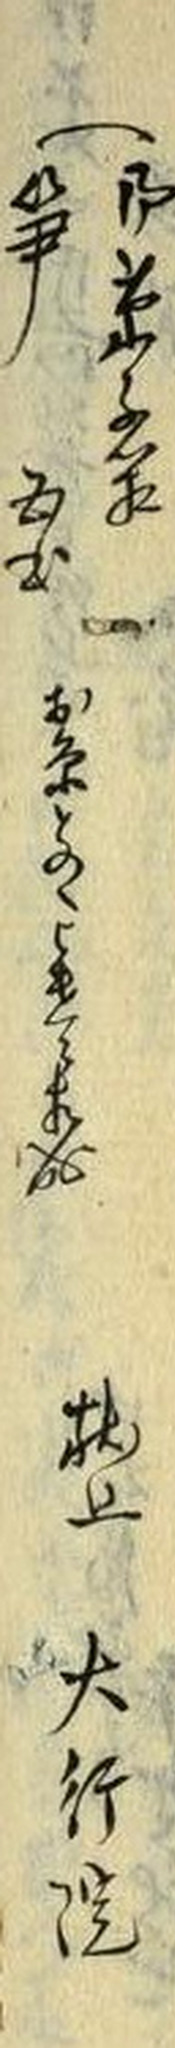笋五本お糸とのへ被遣候ニ相成献上大行院
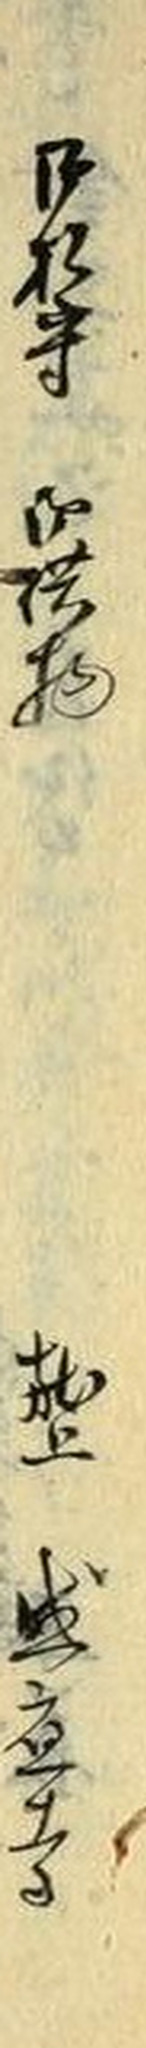御札守御供物献上感応寺
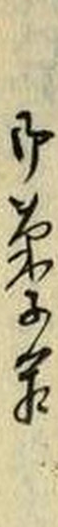御菓子箱
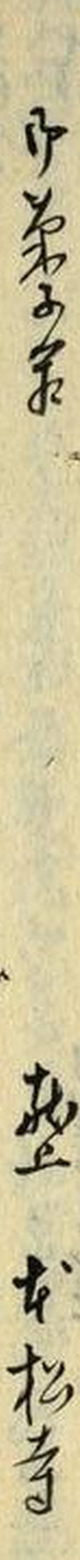御菓子箱献上本松寺
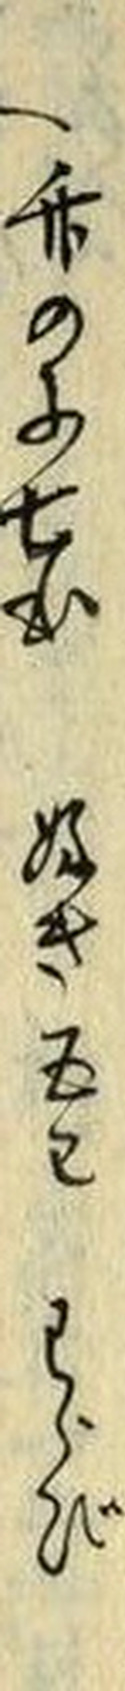竹の子七本ふき五わわらび
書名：少傅日録抄（斉善付側向頭取日記、江戸并道中、初入在国、逝去後…
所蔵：福井県文書館 Fukui Prefectural Archives
